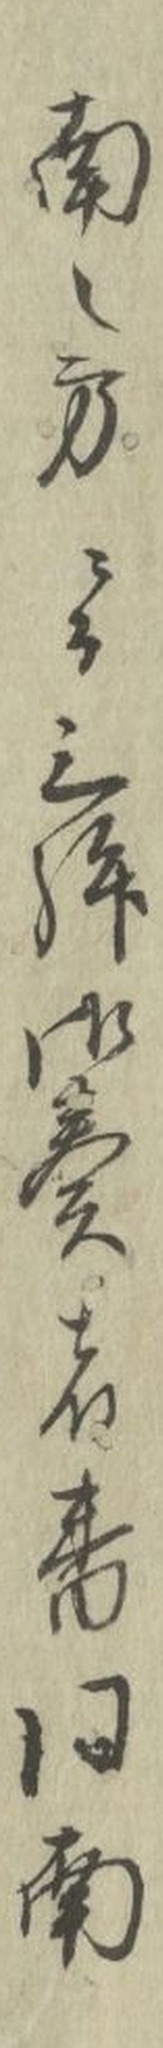南之方に而三拝御奏者番同南
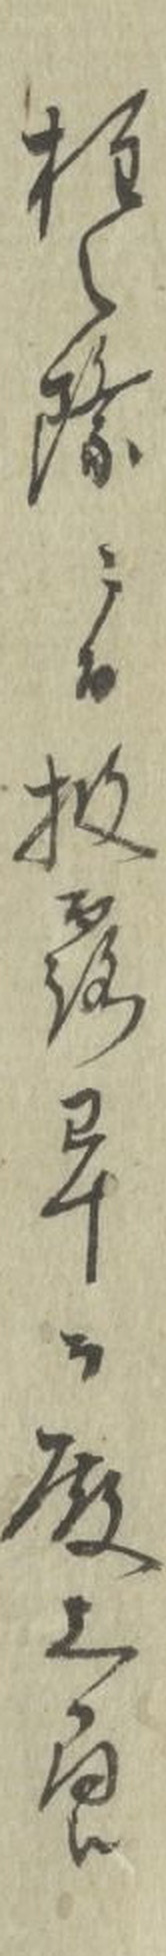柱之際に而披露畢而殿上間え

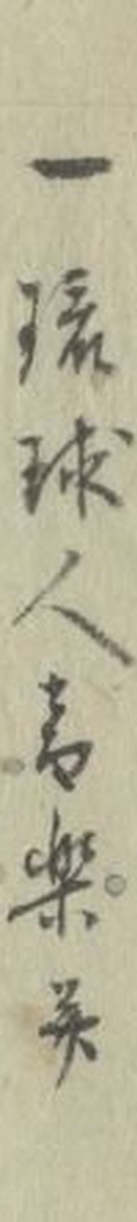一琉球人音楽幷
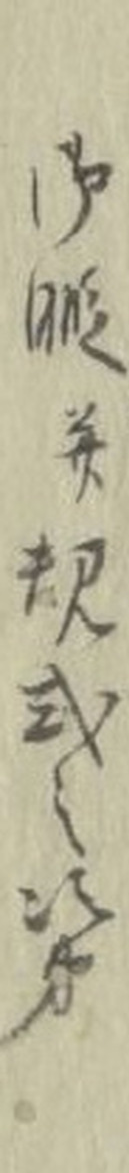御暇幷規式之次第
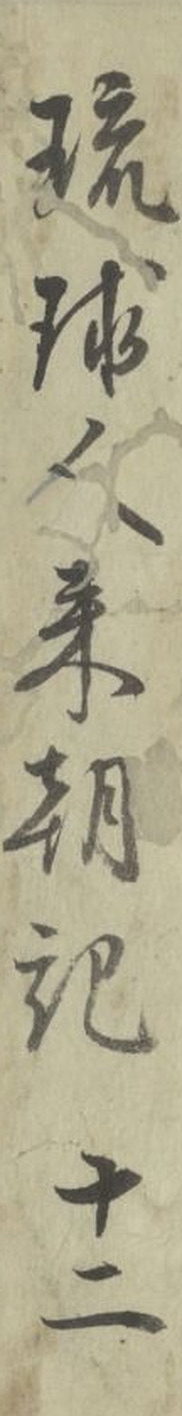琉球人来朝記十二

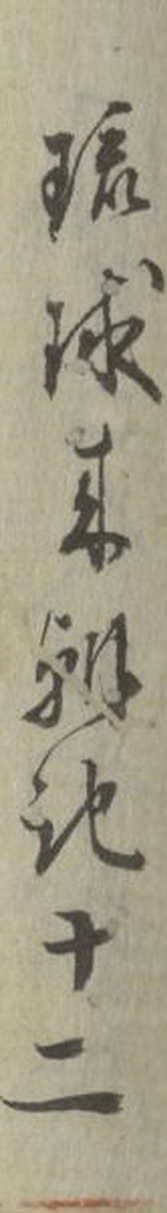琉球来朝記十二
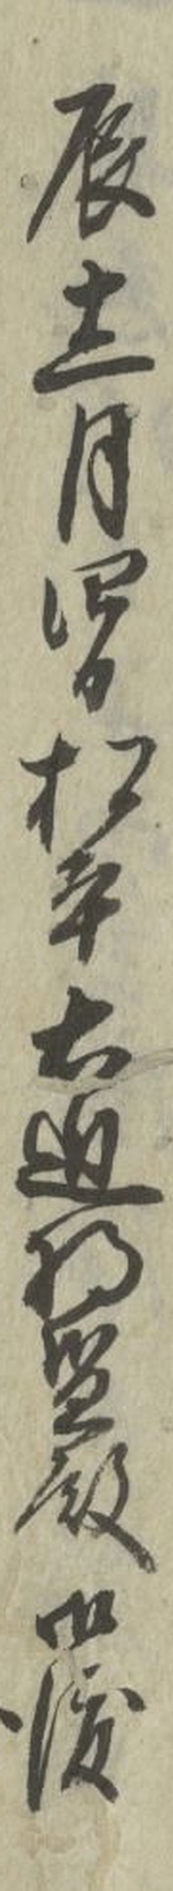辰十二月四日松平右近将監殿御渡
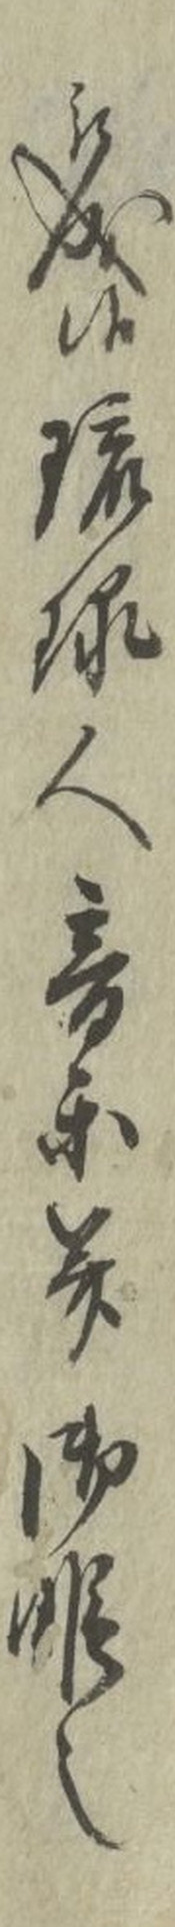被成候琉球人音楽幷御暇之
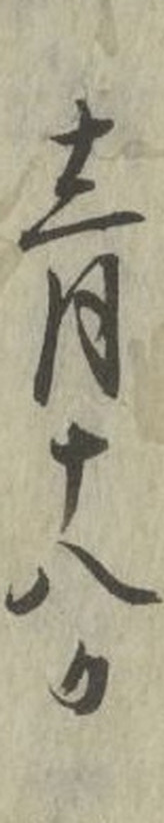十二月十八日

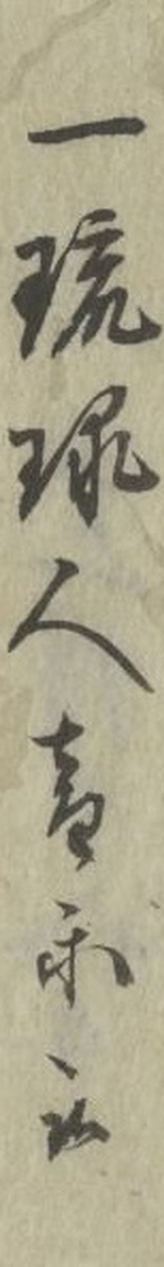一琉球人音楽被
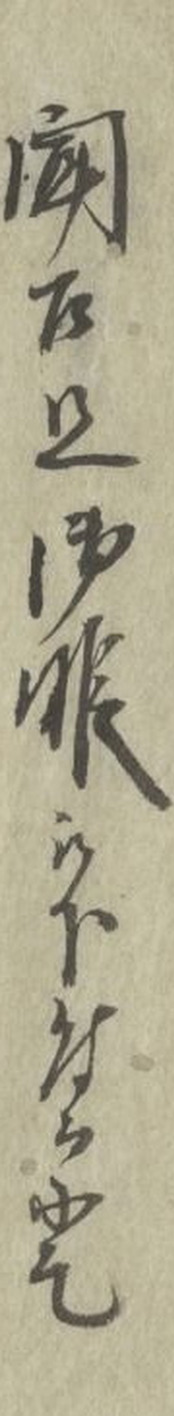聞召且御暇被下付而登
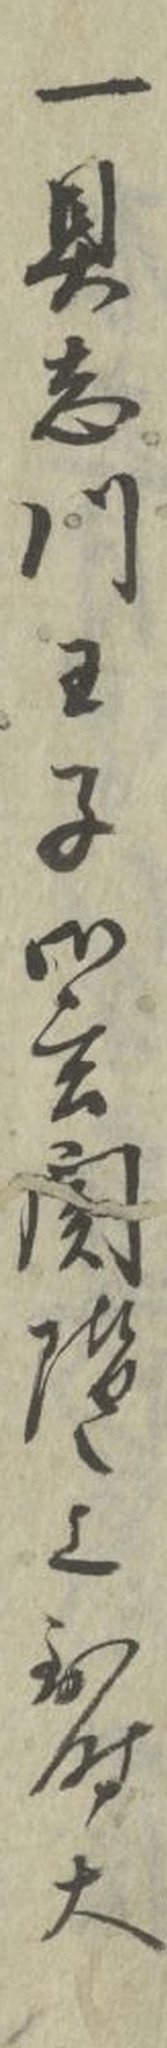一具志川王子御玄関階之上至時大
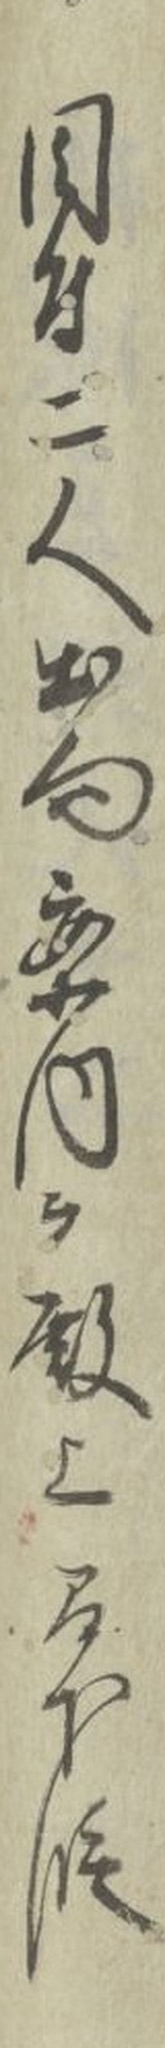目付二人出向案内而殿上間下段
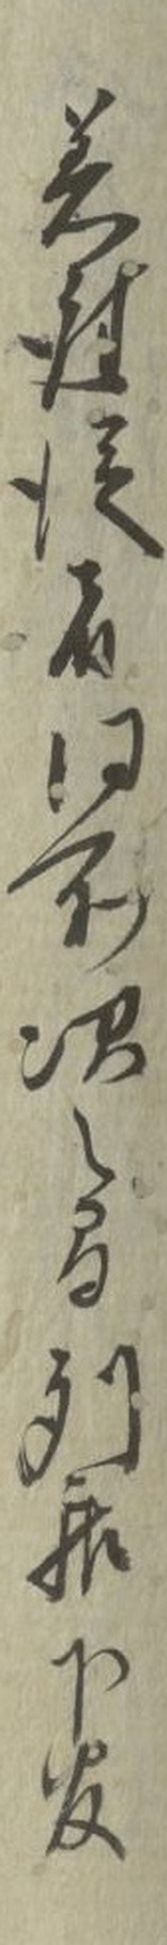着座従者同所次之間列居下官
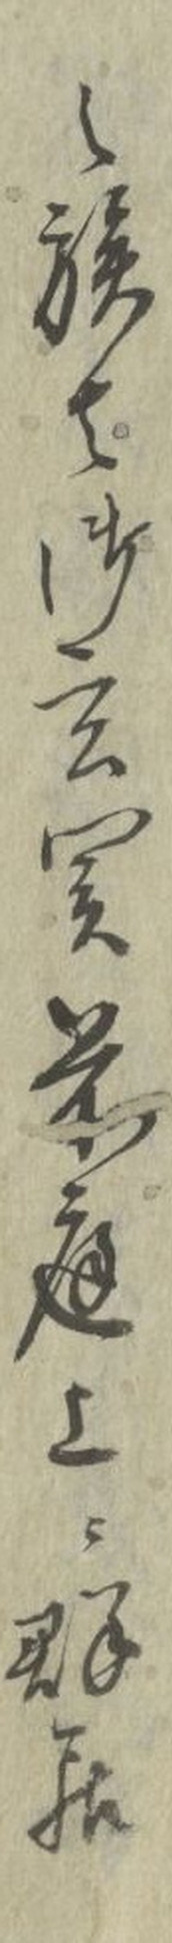之族は御玄関前庭上に群居
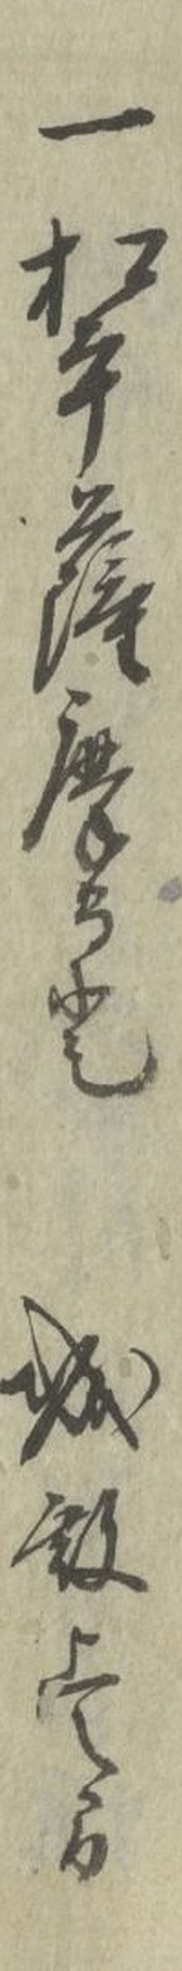一松平薩摩守登城殿上之間
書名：琉球来朝記 自八至十四終
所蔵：University of the Ryukyus Library
